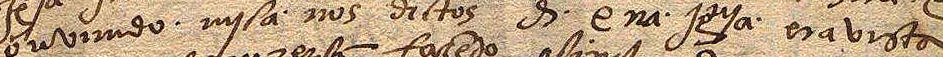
ouvimdo . mjsa. nos dictos di e na. Jḡja era vista
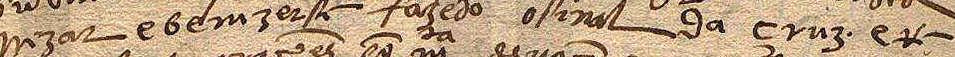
rrezar e bemzerse fazēdo o sinal da cruz. e Re
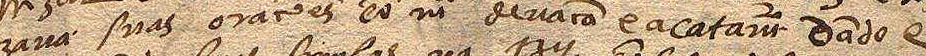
zaua. suas oracões c̄o mta deuac̄a e acatamto dādo e
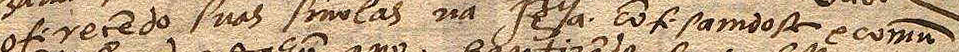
oferecēdo suas smolas na Jḡja. c̄ofesamdose e com̄u
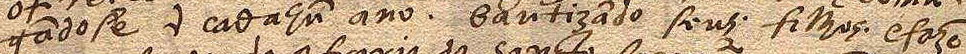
gādose ē cada hū ano . bautizādo seus. filhos. e fazē
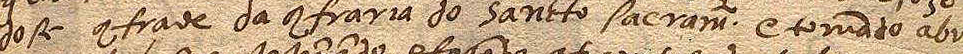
dose ꝯfrade da ꝯfraria do sancto sacramto. e tom̄ado a bu
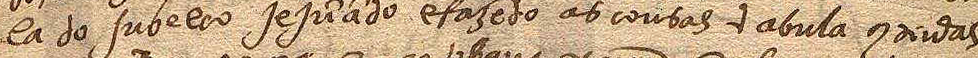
la do Jubeleo JeJūādo e fazēdo as cousas ē a bula ꝯteudas
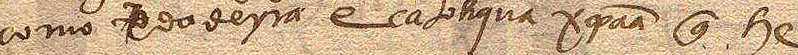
como ꝟdadeyra. e catoliqua xpāa q̄ he
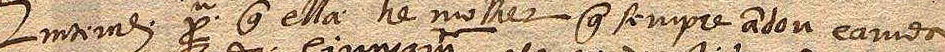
Emtemdj ꝓ̄. q̄ ella. he molher q̄ sempre ādou e amda
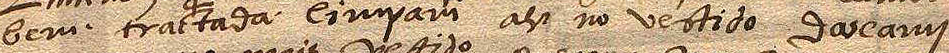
bem. tractada. limpamte asi no vestido das camj
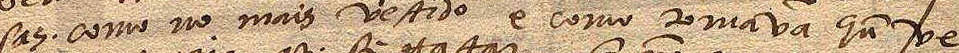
sas. como no mais vestido e como tomava hū ve
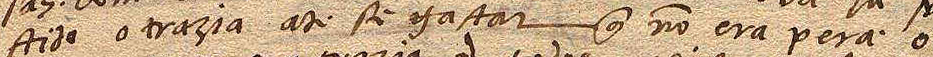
stido o trazia ate se gastar q̄ n̄o era pera. o
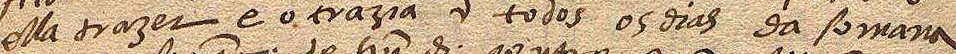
ella trazer e o trazia ē todos os dias da somana
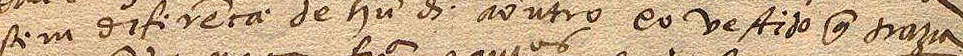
sem diferēca. de hū di a outro e o vestido q̄ trazia
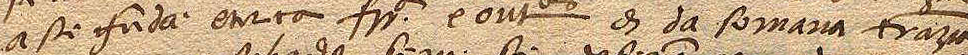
a segūda. e terca frra. e outos di da somana trazia
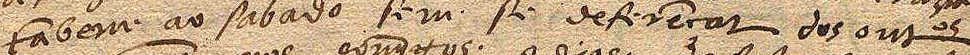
tābem. ao sabado sem. se deferēçar dos outos
